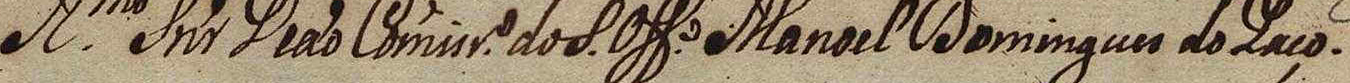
R.mo Sn̄r Deão Com̄isr.o do S. Off.o Manoel Domingues do Paço.
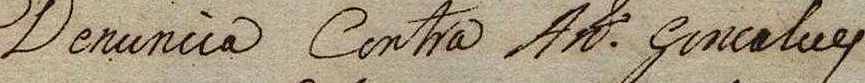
Denuncia Contra An.to goncalues
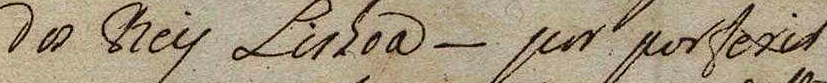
dos Reis Lisboa- por porferir
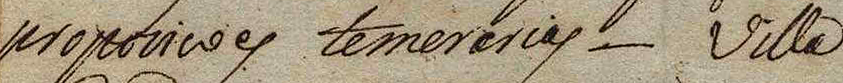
propozicoes temerarias- Villa
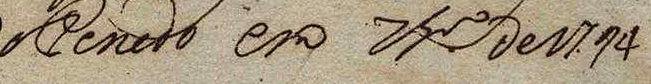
de Penedo em 7bro de 1794
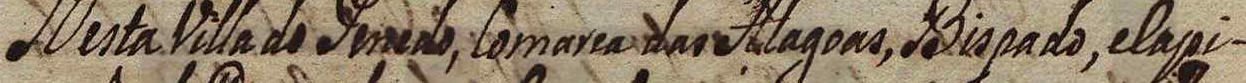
Nesta Villa do Penedo, Comarca das Alagoas, Bispado, e Capi
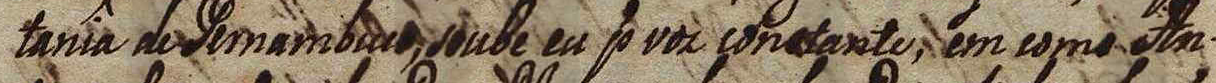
tania de Pernambuco, soube eu p̄ voz constante, em como An
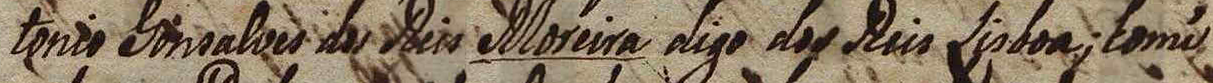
tonio Gonsalves dos Reis Moreira digo dos Reis Lisboa, homē
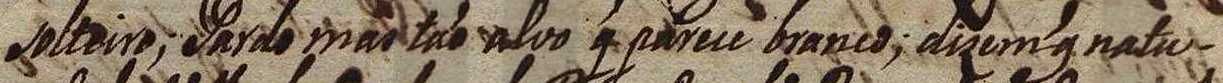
solteiro, Pardo mas taõ alvo q̄ parece branco; dizem q̄ natu
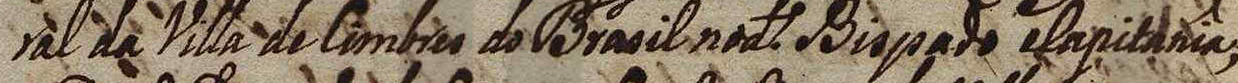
ral da Villa de Cimbres do Brasil no d̄.o Bispado e Capitania,
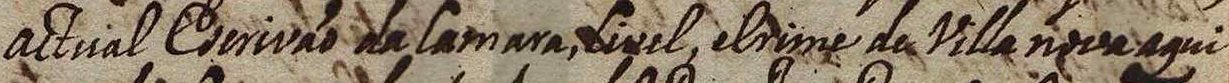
actual Escrivaõ da Camara, Civel, e Crime de Villa nova aqui
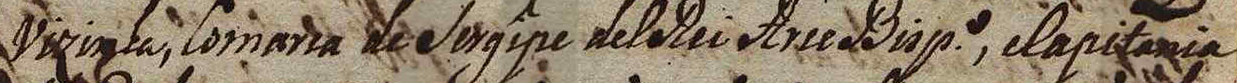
Vizinha, Comarca de Sergipe del Rei ArceBisp.o, e Capitania
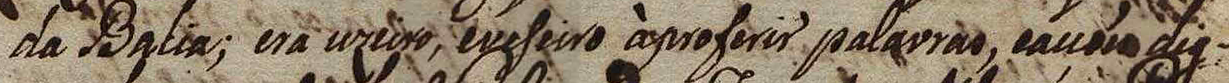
da Bahia; era uzeiro, e veseiro à proferir palavras, e acções dig
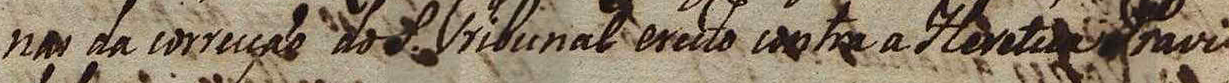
nas da correcçaõ do S. Tribunal erecto contra a Heretica Pravi
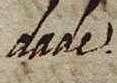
dade.
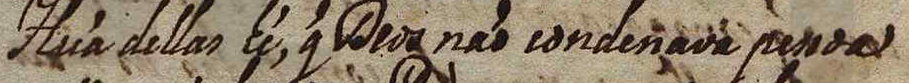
Hūa dellas hé, q̄ Deos não condenava pessoa
